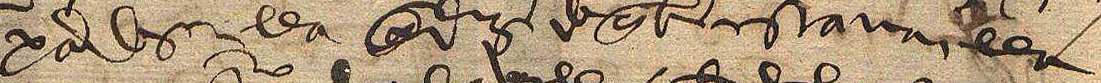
xādose ella e dizēdo q̄ bē estaua ela
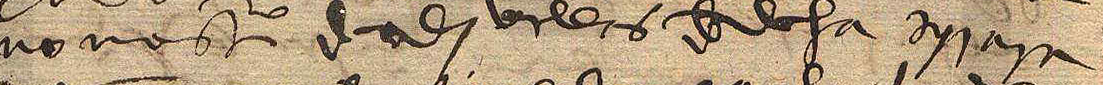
no mostro de odjvellas dōde ha tyrara
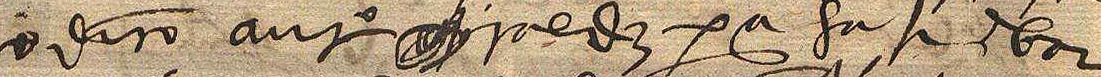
o dito anto gyraldez ꝑa ha Jr ēbar
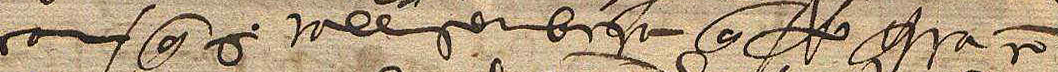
car / q̄ se tall soubera q̄ ffogjra c̄o
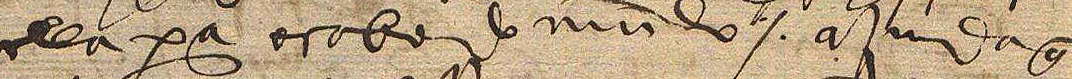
ella ꝑa o cabo do mūdo ./. aJnda q̄
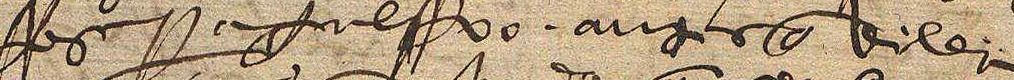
ffose fagulffoo . antes q̄ vella
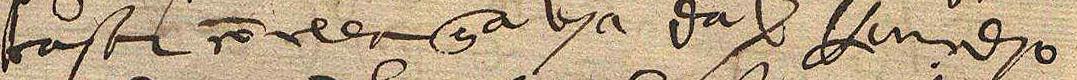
casar c̄o ella q̄ avja daꝟ Remedjo
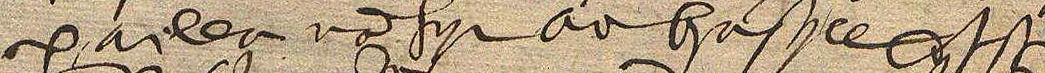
ꝑa ella nā hyr ao brasjll e Jsto
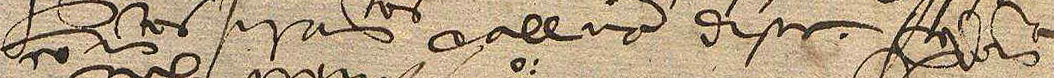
c̄o mtos Juramtos e all nā dise. frco domra
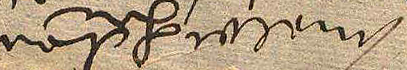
notro ho escreuy
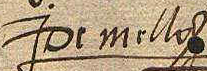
Jo de mello
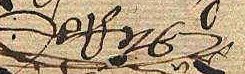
Do Rybro
